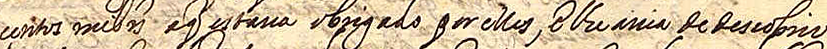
çentos mil rs̄ a q̄ estaua obrigado por elles, e lhe auia de descobrir
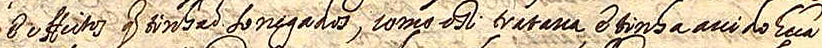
e effeitos q̄ tinhão sonegados, como o R. trataua, e tinha auido huā
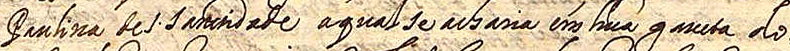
Paulina de S. Santidade a qual se acharia em hūa gaueta do
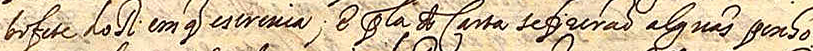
bofete do R. em q̄ escreuia; e p̄la d̄ Carta se fizerão alguās penho
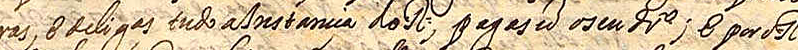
ras, e deligas, tudo a Instançia do R., pagas cō o seu dro; e por o R.
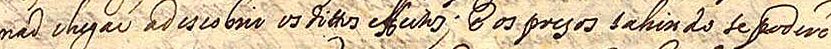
naõ chegar a descobrir os dittos effeitos; e os prezos sahindo se poderē
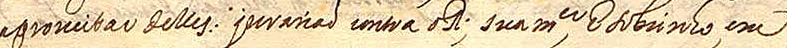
aproueitar delles: jurariaõ contra o R., sua mer e sobrinho, em
